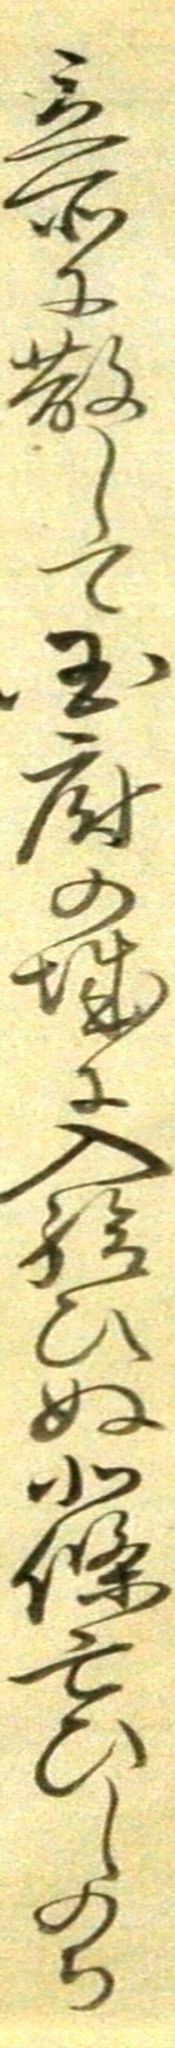立所に散して国府の城に入給ひぬ北条亡ひしのち
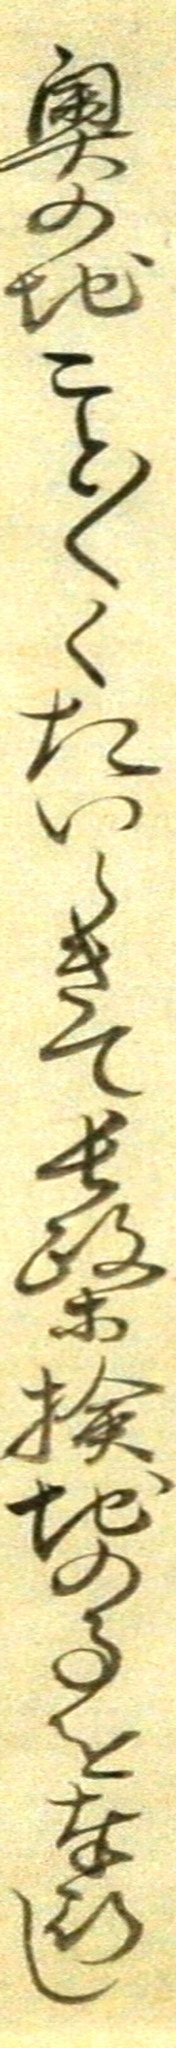奥の地こと〳〵くたいらきて長政等検地の事を奉行し
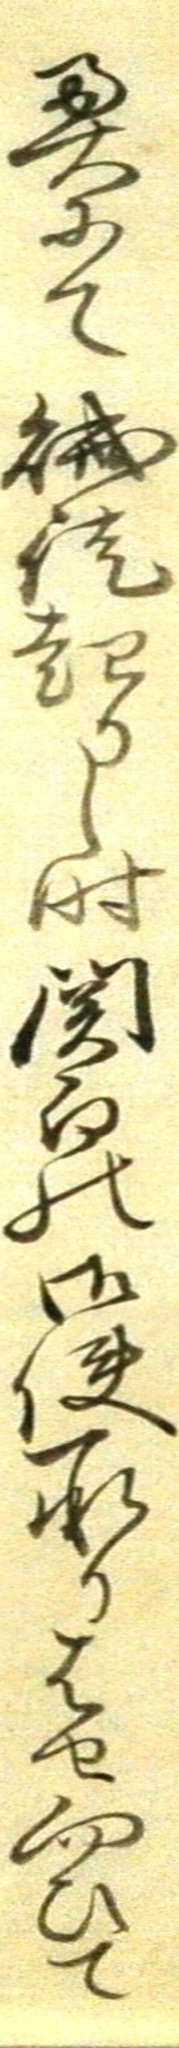奥にて賊徒起りし時関白の御使承りはせ向ひて
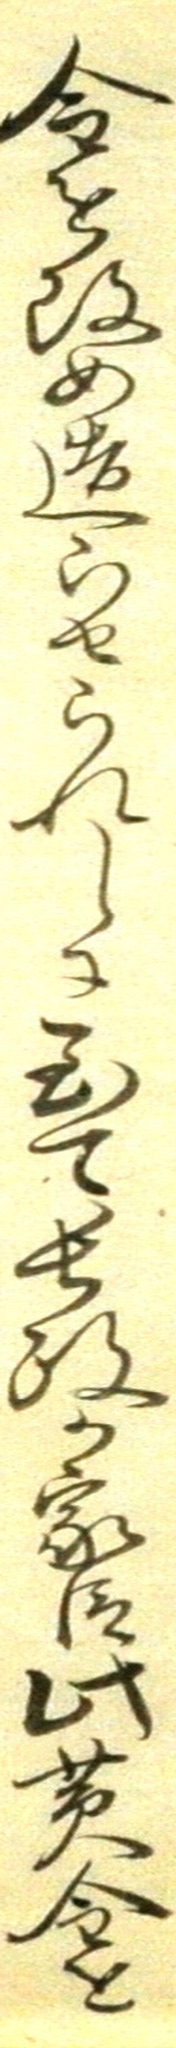金を改め造らせられしに至て長政か家臣此黄金を
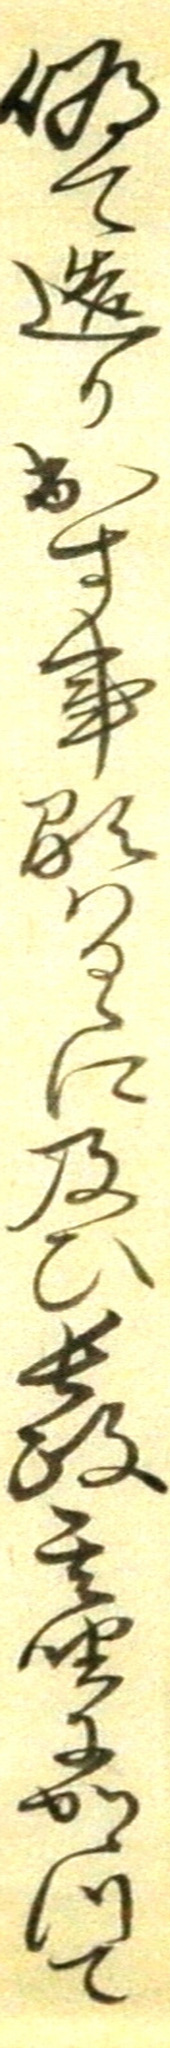偽て造り出す事顕はるゝに及ひ長政其坐にかゝつて
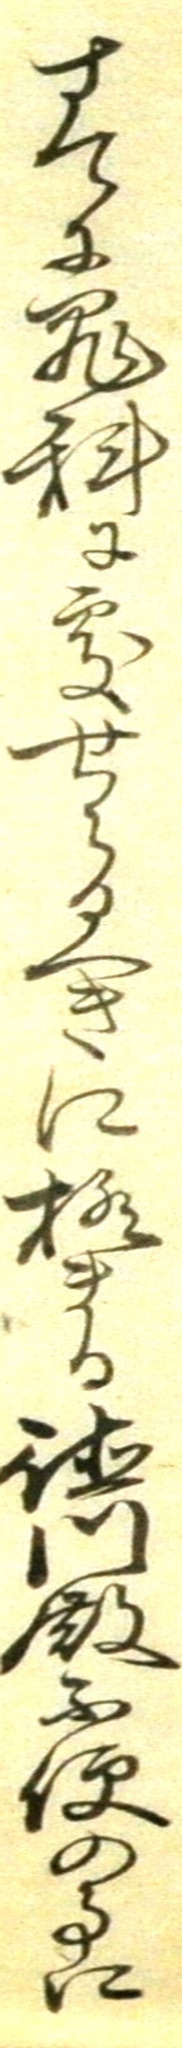すてに罪科に処せらるへきに極まる徳川殿不便の事に
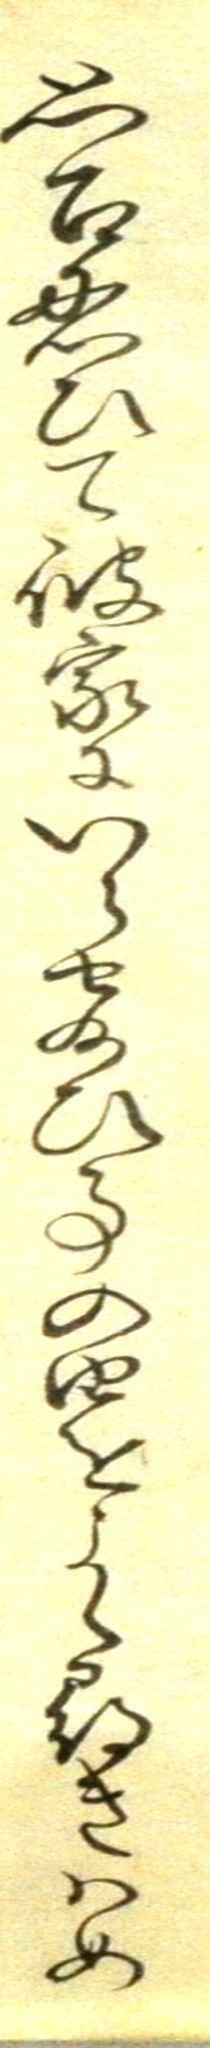思召忍ひて彼家にいらせ給ひ事の由をよく尋きはめ
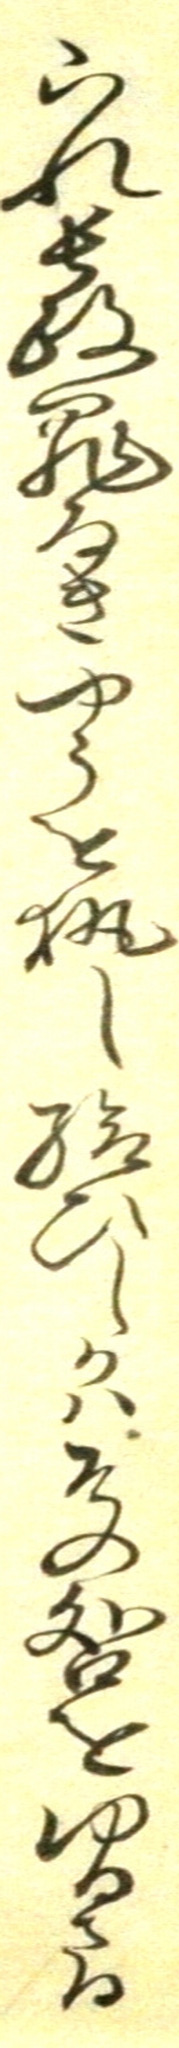られ長政罪なきやうを執し給ひしかはその咎をゆるさる
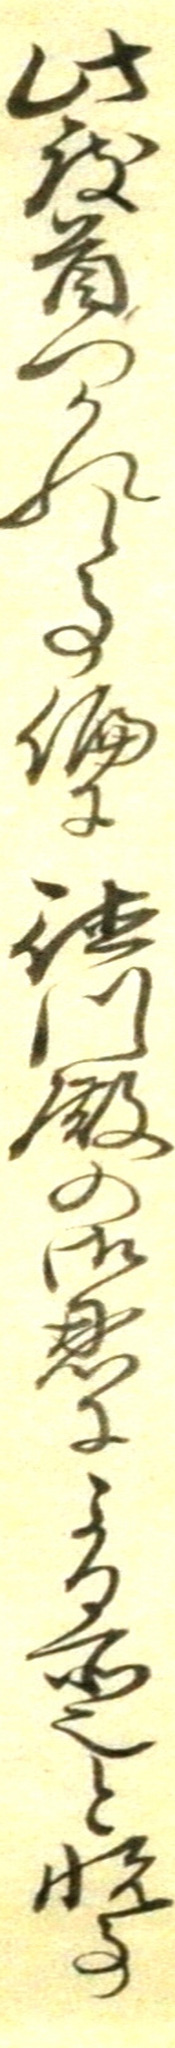此度首つかれし事偏に徳川殿の御恩による所也と悦事
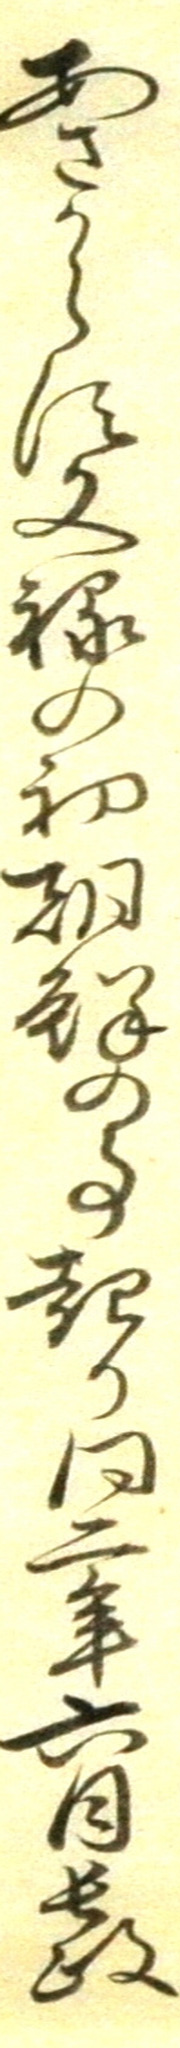あさからす文禄の初朝鮮の事起り同二年六月長政
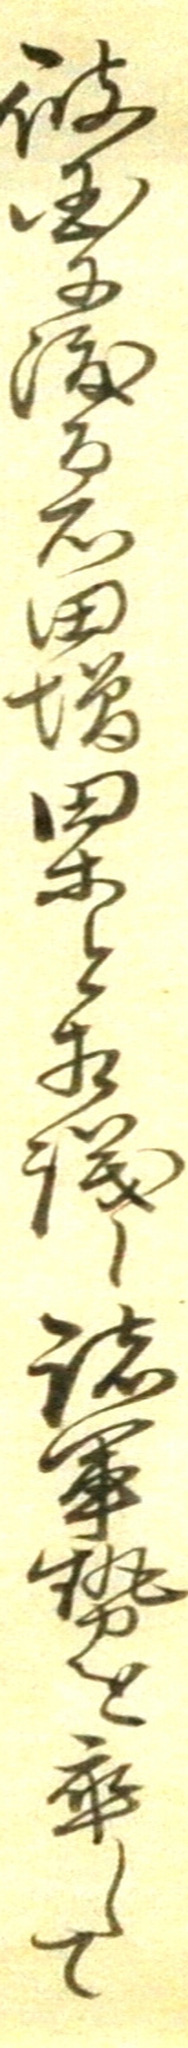彼国に渡る石田増田等と相議し諸軍勢を率して
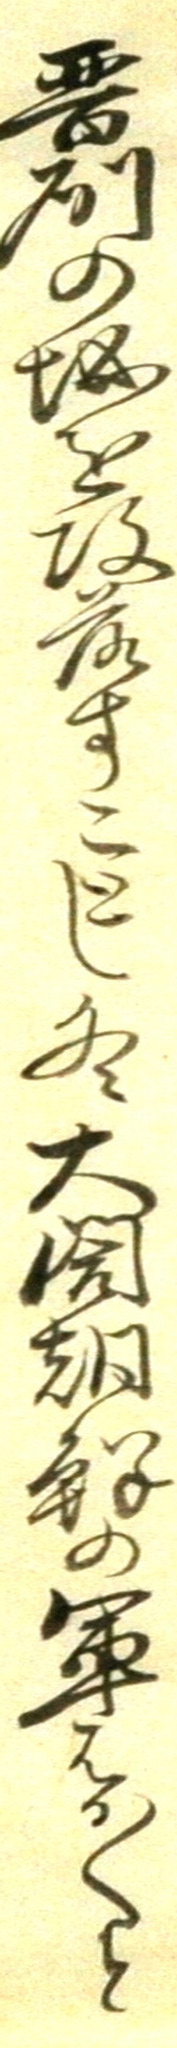晋州の城を攻落すことし冬太閤朝鮮の軍はる〳〵と
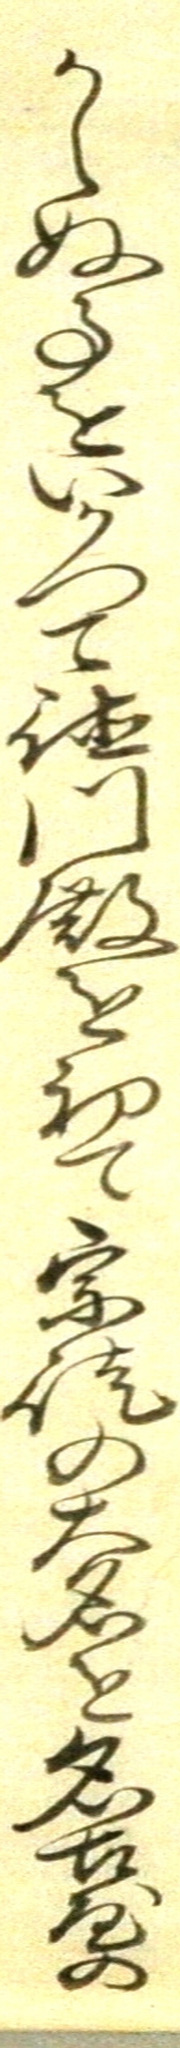かしぬ事をいかつて徳川殿を初て宗徒の大名を名古屋の
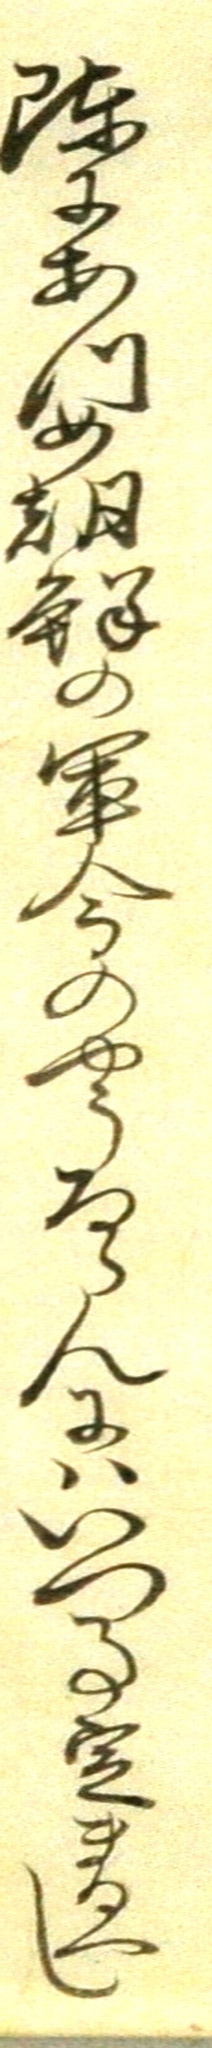陣にあつめ朝鮮の軍今のやうならんにはいつ事定まるへし
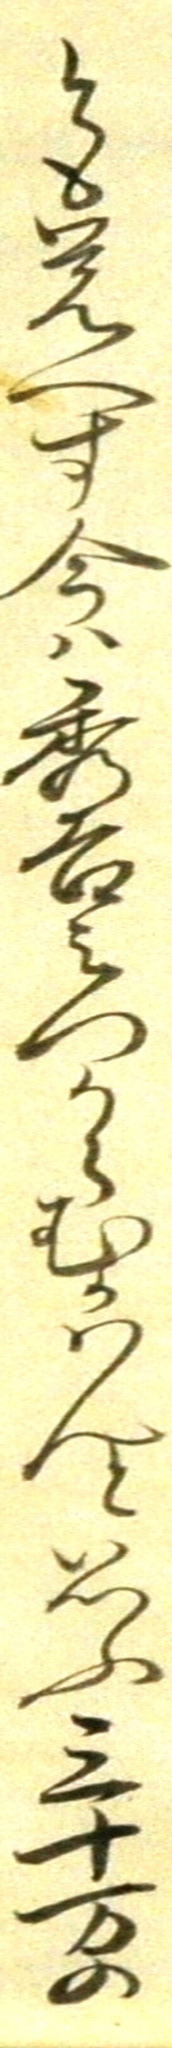とも覚へす今は秀吉みつからむかわんと思ふ三十万の
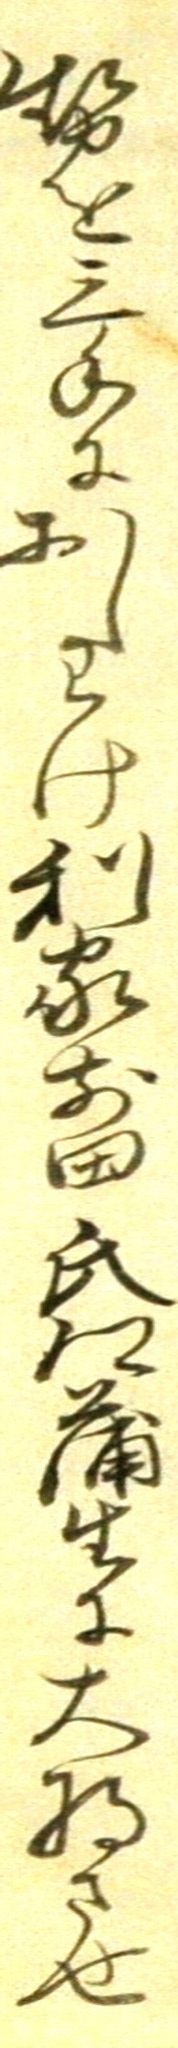勢を三手におしわけ利家前田氏郷蒲生に大将させ
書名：藩翰譜（七・上）
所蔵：伊那市立高遠町図書館・合同会社AMANE
